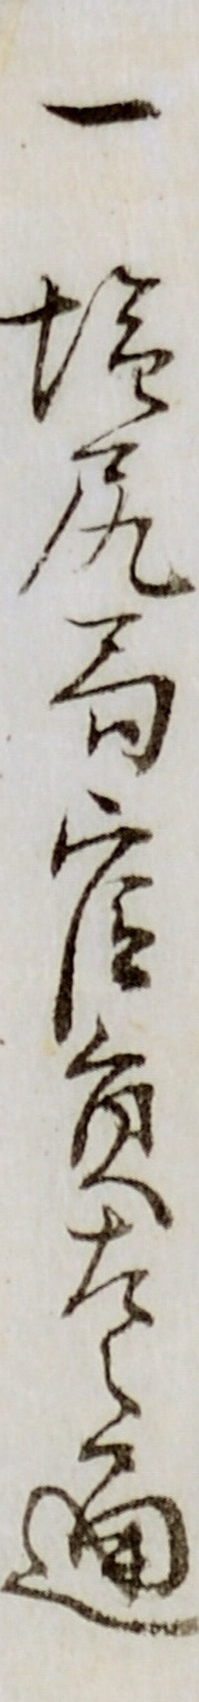一塩尻局官員左之通
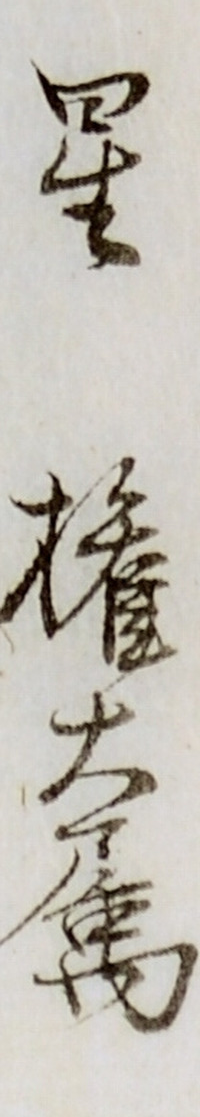星権大属
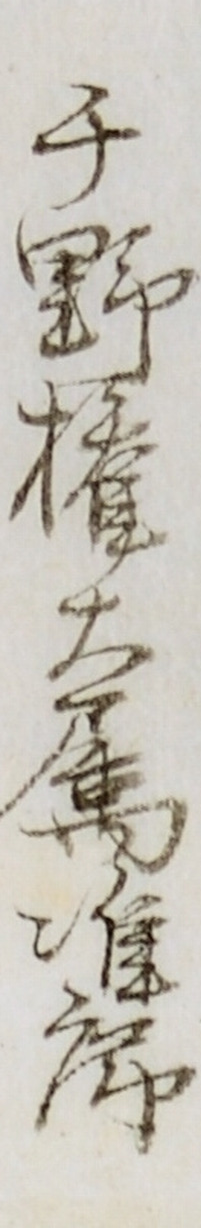千野権大属准席
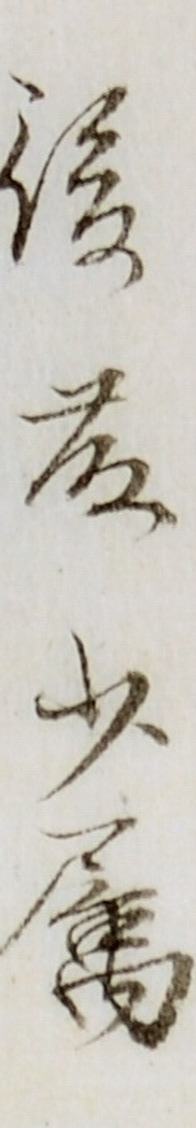後藤少属
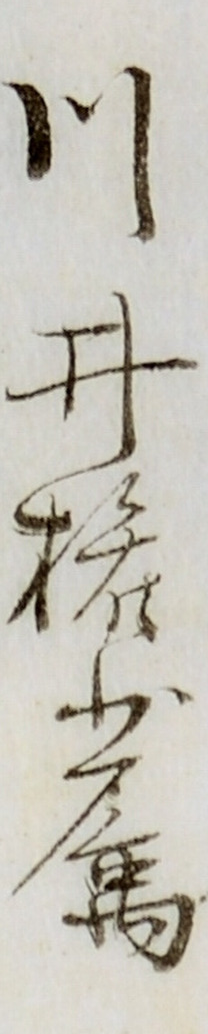河合権少属
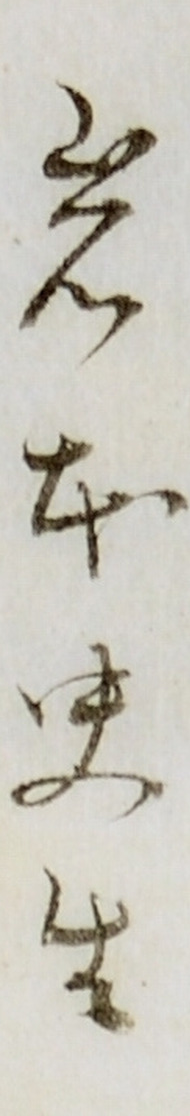岩本史生
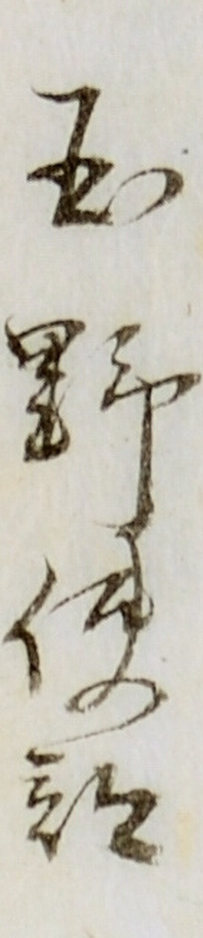玉野使部
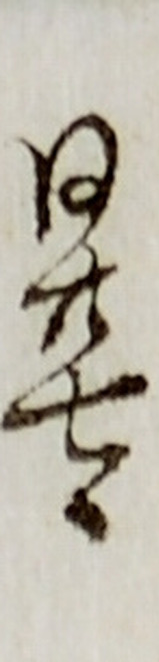同廿七日
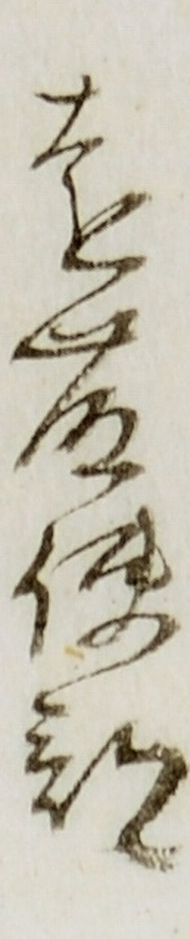遠藤使部
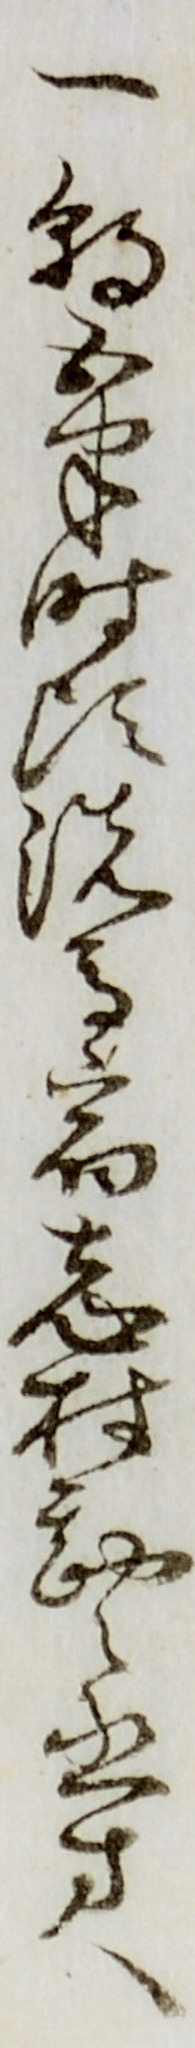一朝五半時頃洗馬宿志村勘之丞方へ
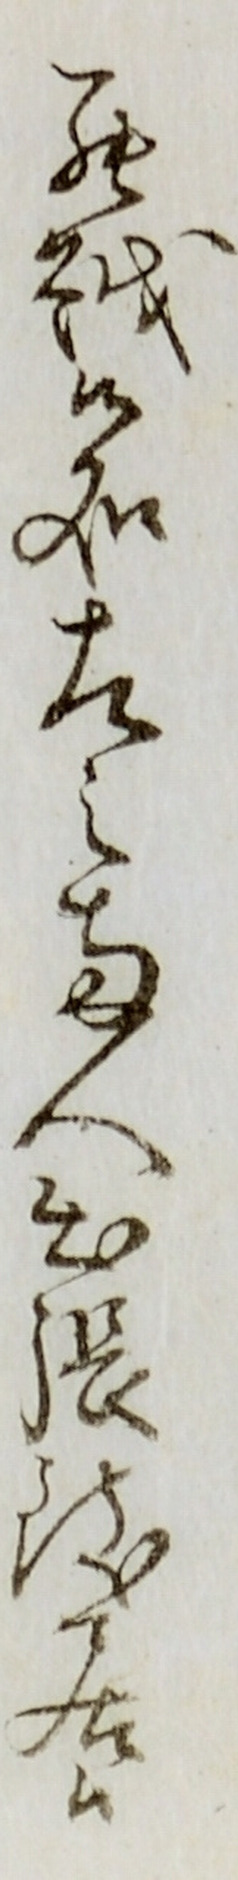罷越候処左之両人出張致居候
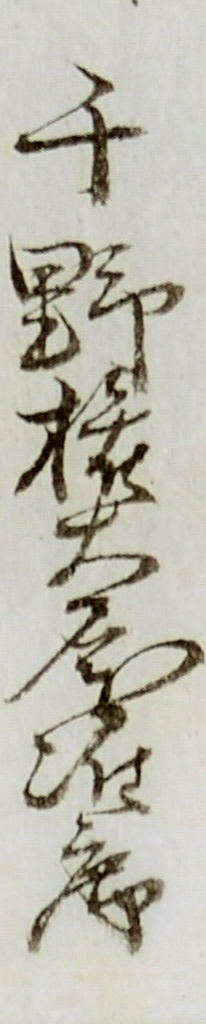千野権大属准席
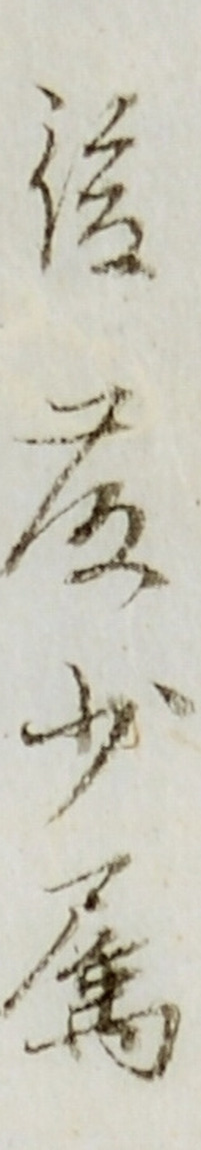後藤少属
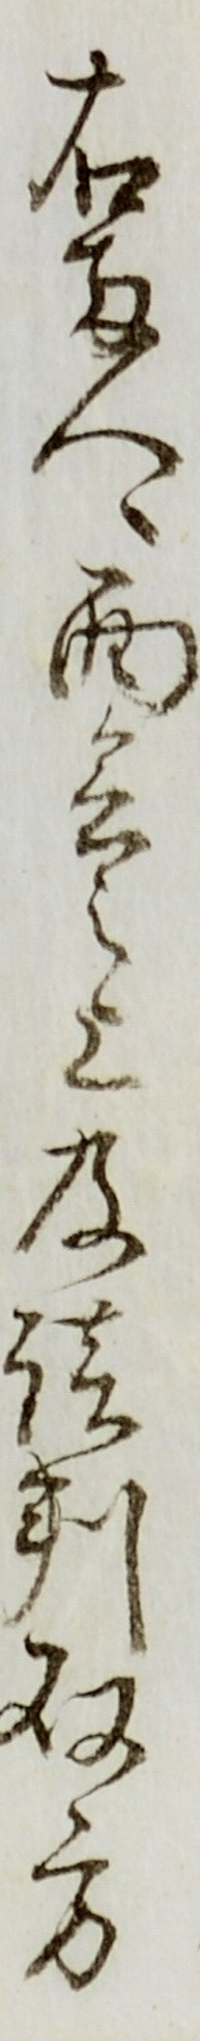右両人へ面会之上及談判双方
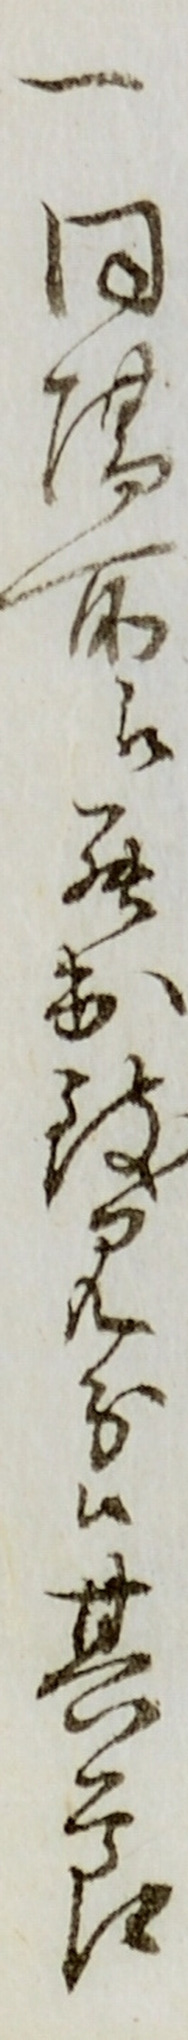一同場所え罷出致見分候其節
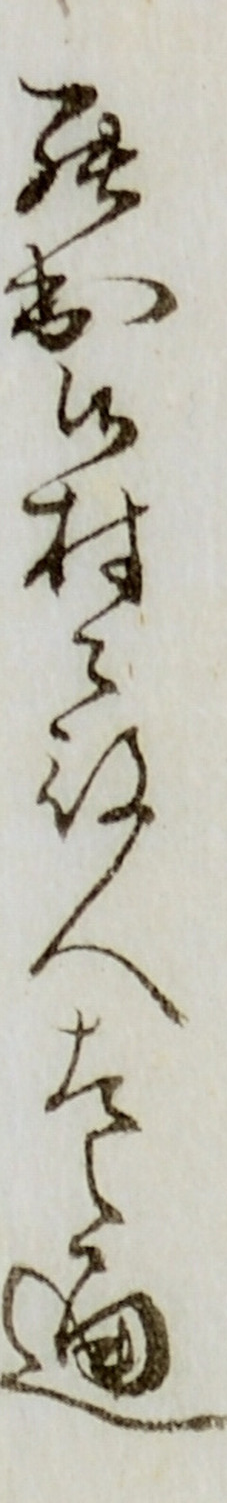罷出候村々役人左之通
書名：山林方諸事御用留
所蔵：伊那市立高遠町図書館・合同会社AMANE
